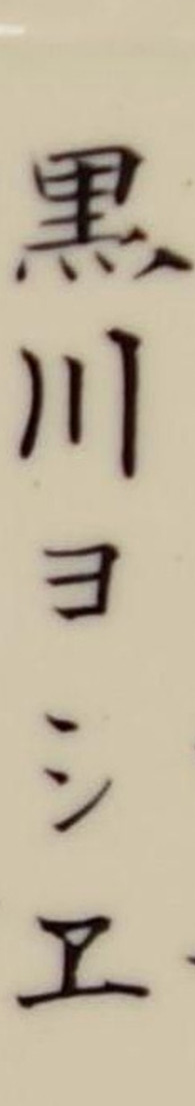黒川ヨシエ
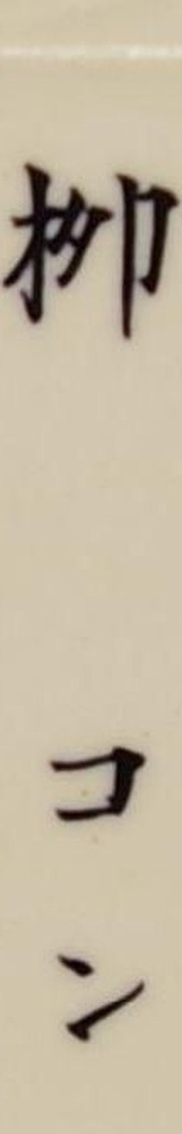柳コン
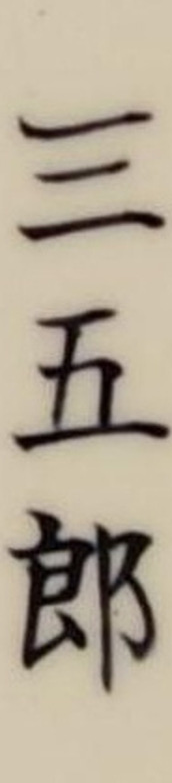三五郎
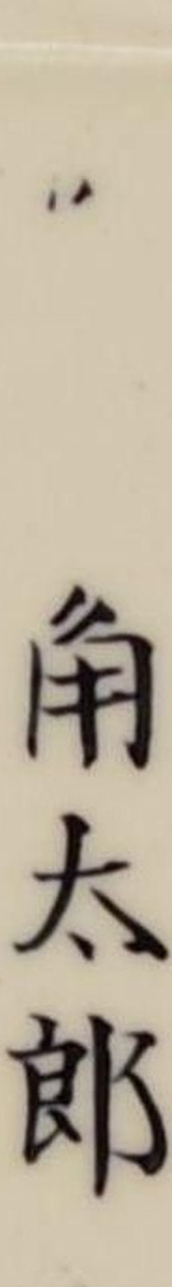角太郎
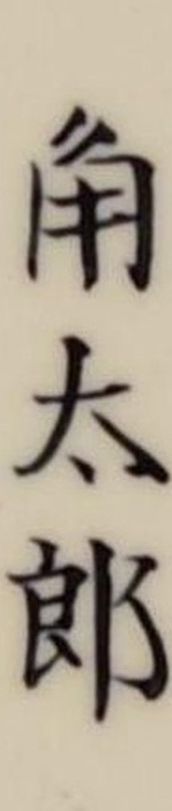角太郎
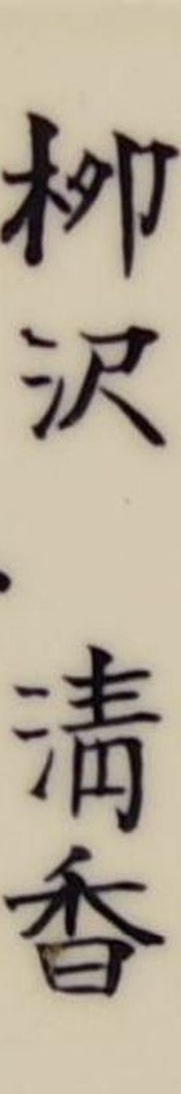柳沢清香
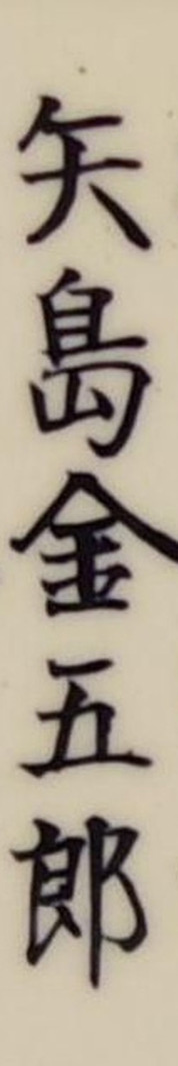矢島金五郎
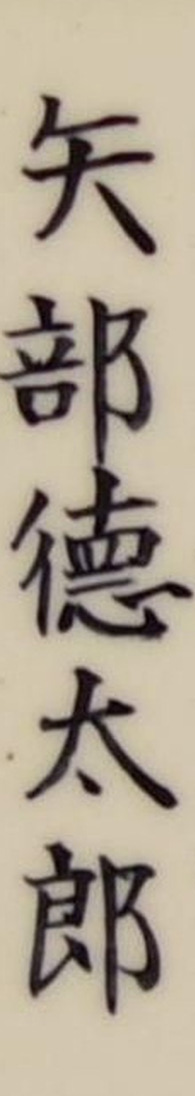矢部徳太郎
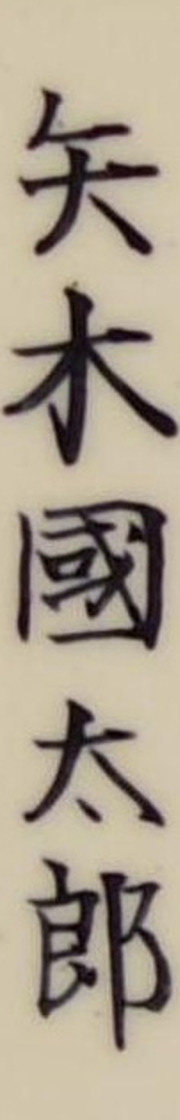矢木國太郎
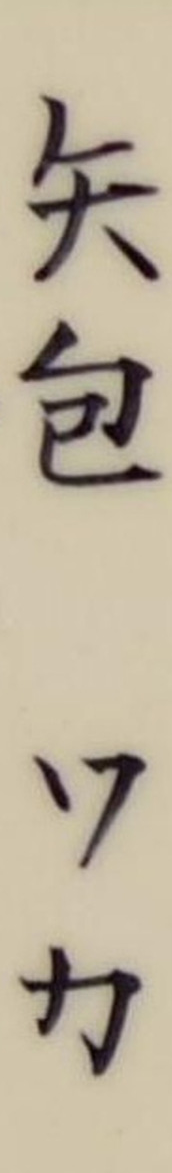矢包ワカ
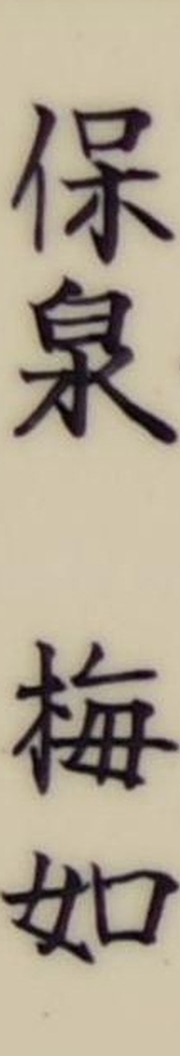保泉梅如
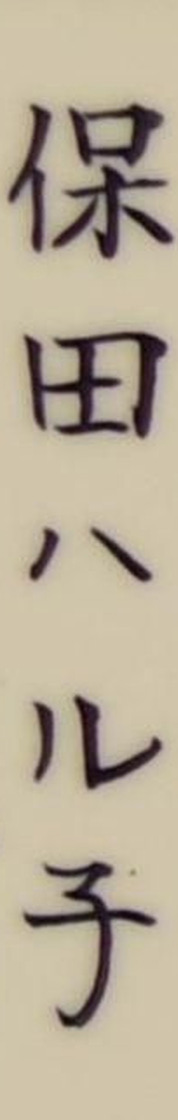保田ハル子
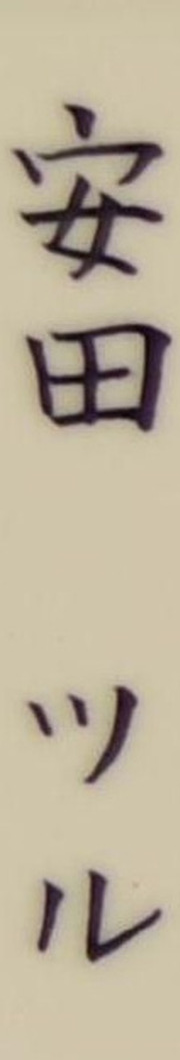安田ツル
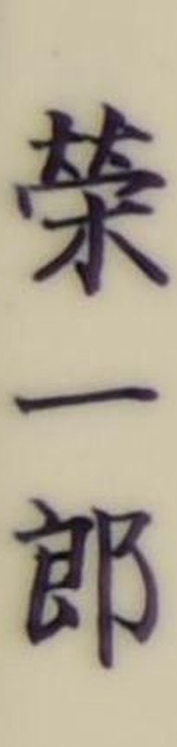榮一郎

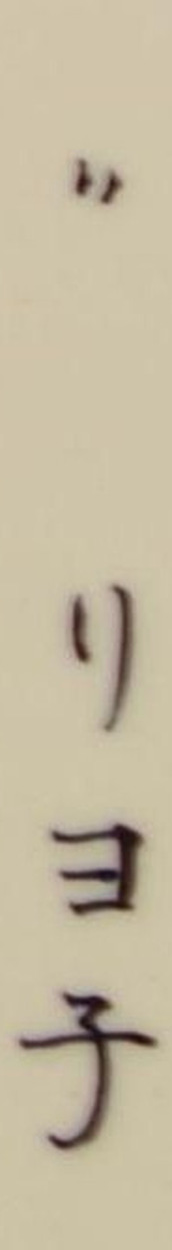リヨ子
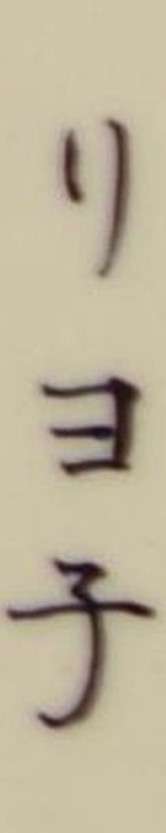リヨ子
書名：E~L
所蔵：高野山金剛峯寺
